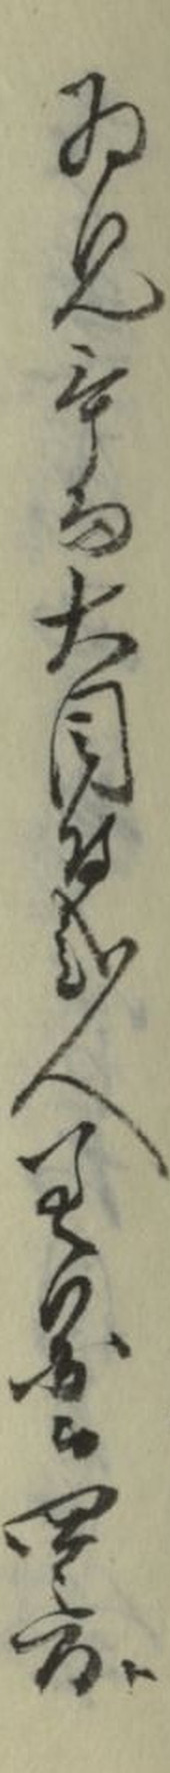為見畢而大目付二人差図而四之間え
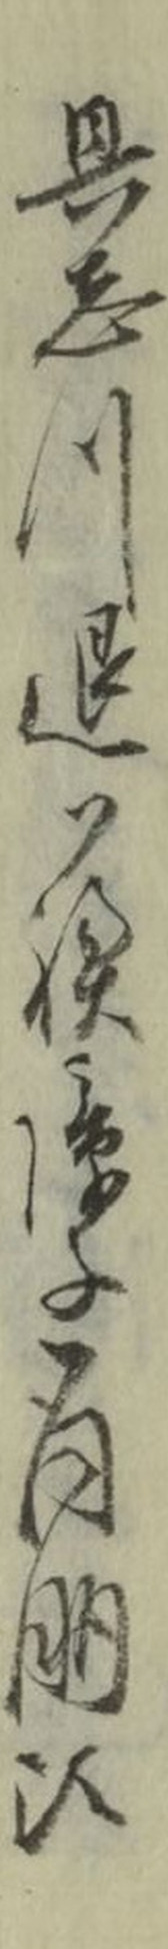具志川退御襖障子御同朋頭
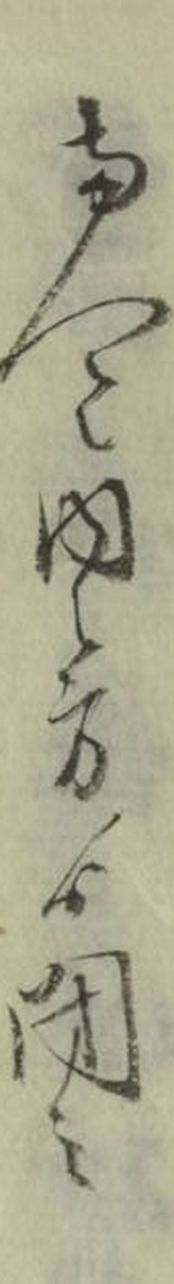両人にて内之方ゟ閉之
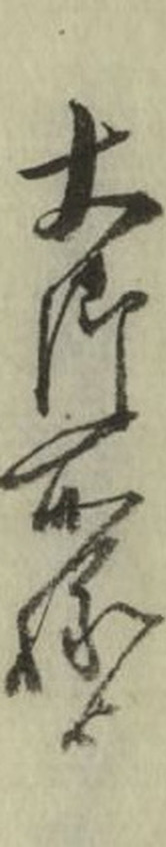大御所様ゟ

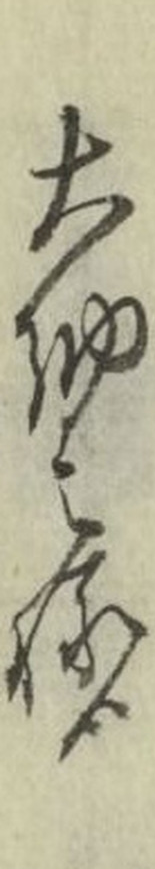大納言様ゟ
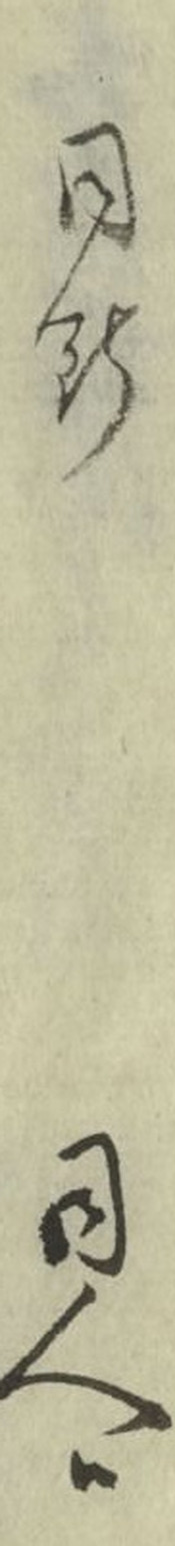同断同人え
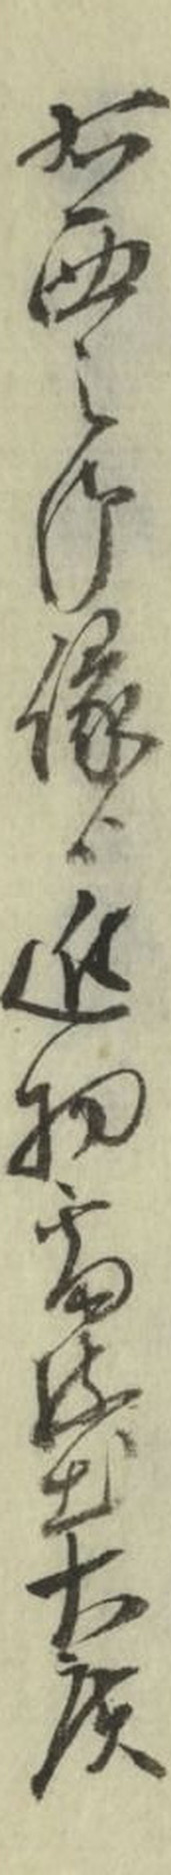右西之御縁ゟ進物番持出大広
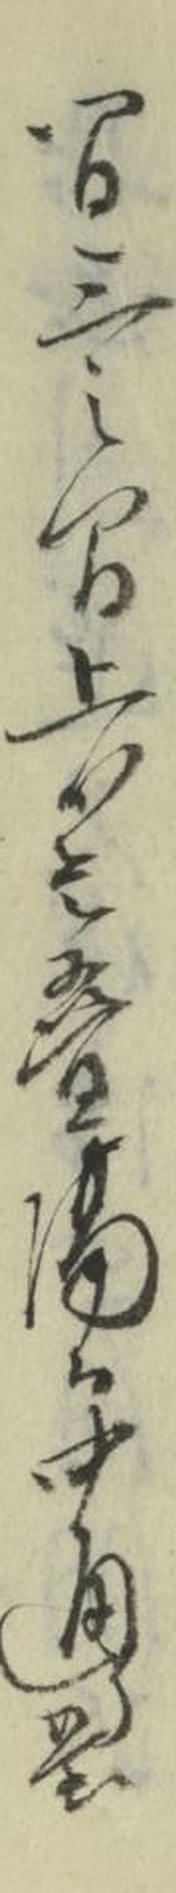間三之間上ゟ壱畳隔而中通り台
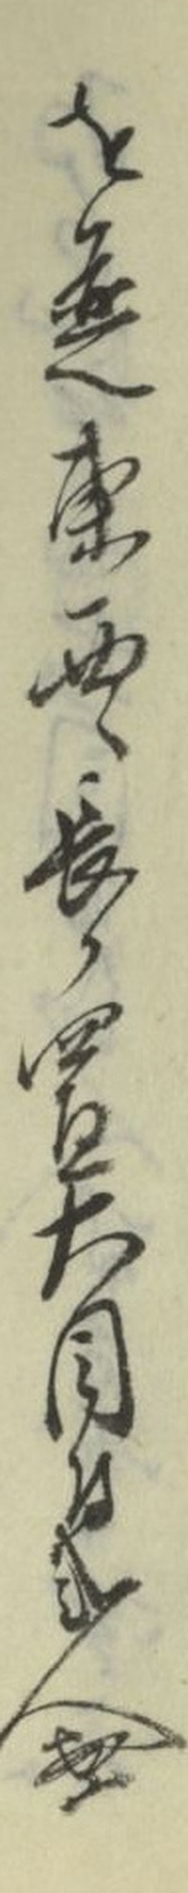を並へ東西へ長く置大目付弐人案
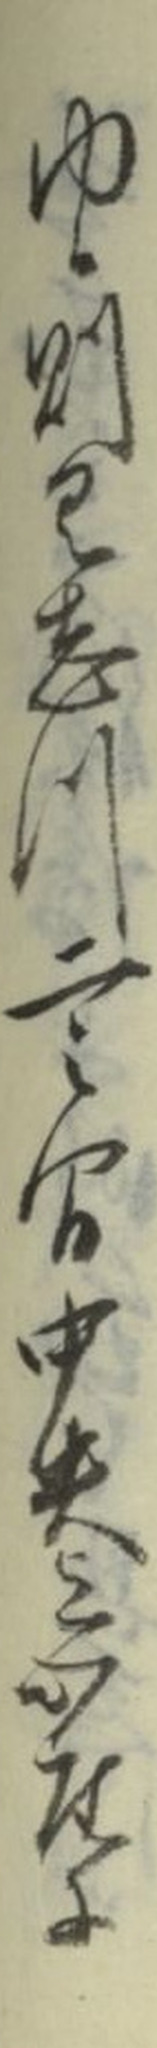内而則具志川二之間中央迄出座之于
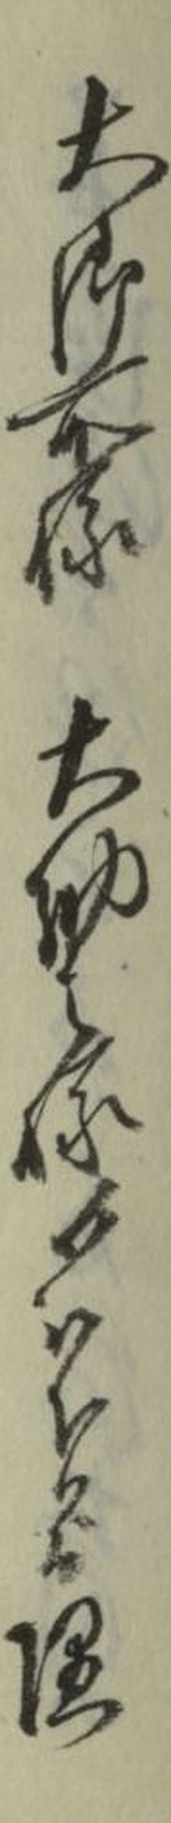大御所様大納言様ゟ被下旨隠
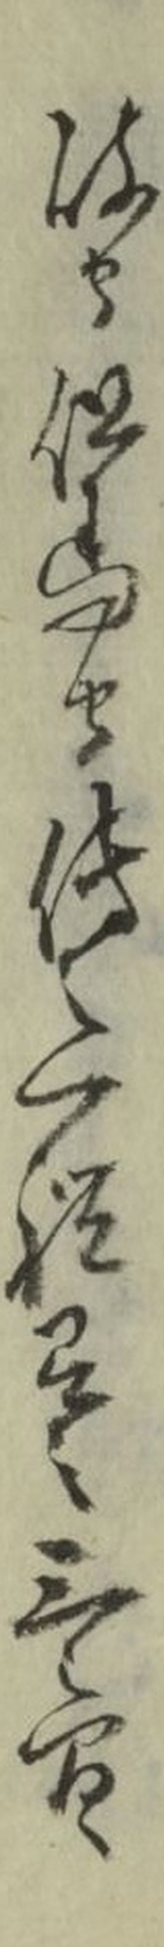岐守但馬守伝之一礼有之三之間へ
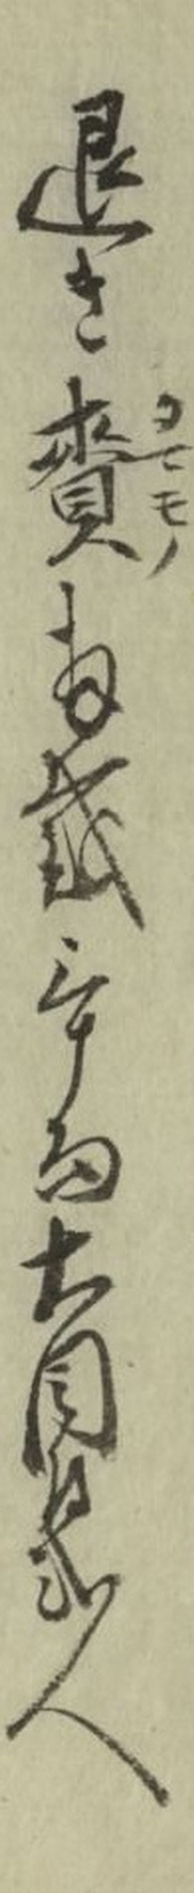退き賚拝戴畢而大目付弐人
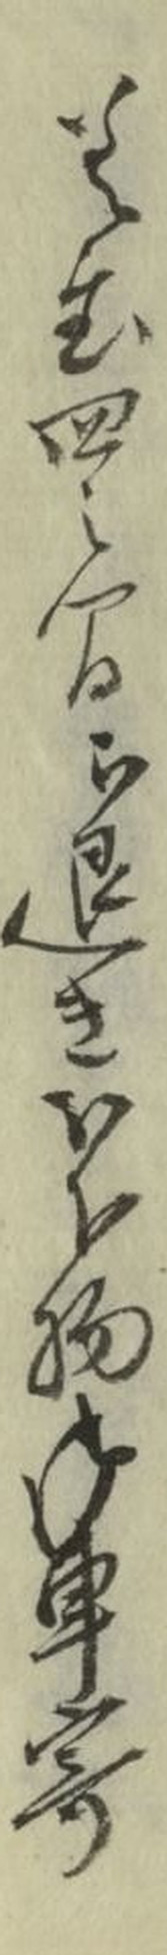差図四之間え退き被下物御車寄
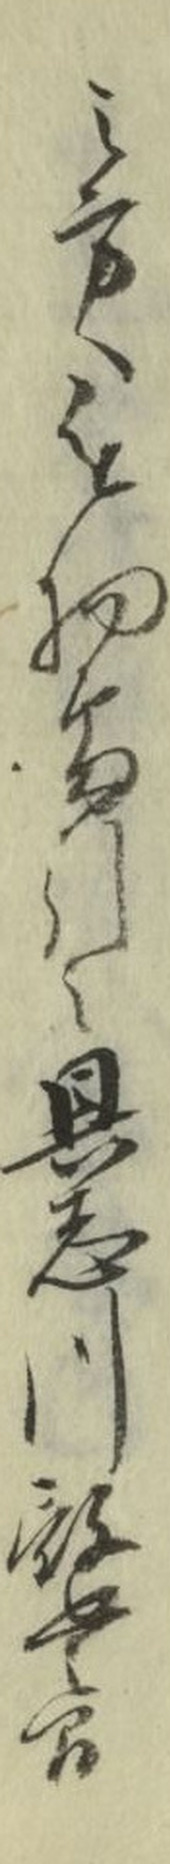之方へ進物番引之具志川殿上之間

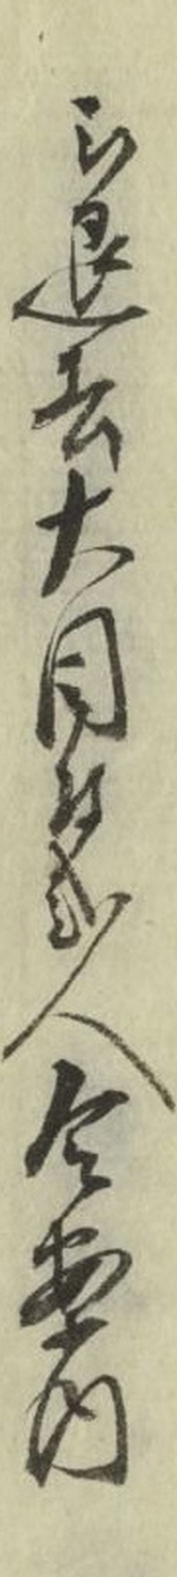え退去大目付弐人令案内
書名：琉球人来朝記 四之五
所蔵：University of the Ryukyus Library
